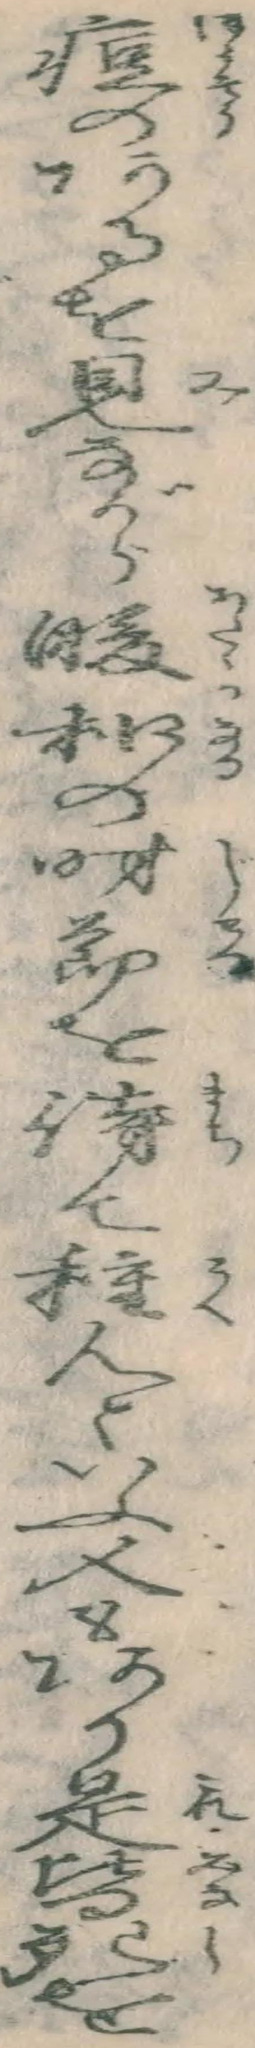痘のあるを見ながら暖和の時節を待て種んといふ人もあり是皆死を
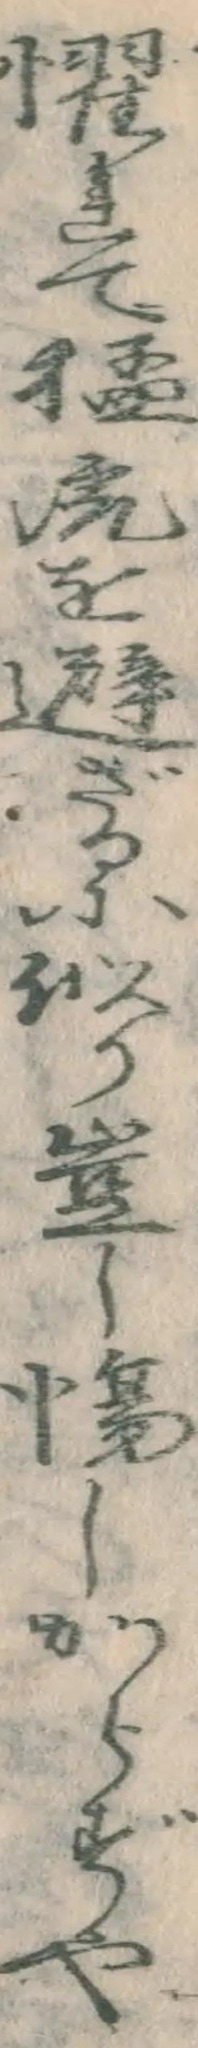惧れて猛虎を避ざるに似り豈し傷しからずや
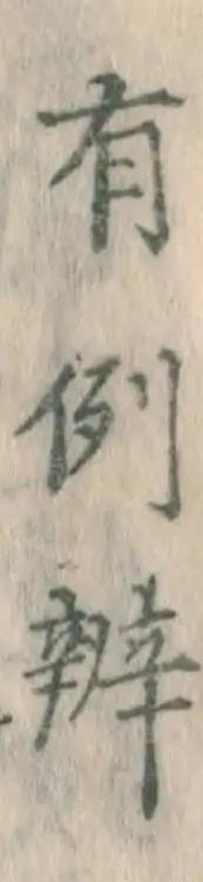有例弁

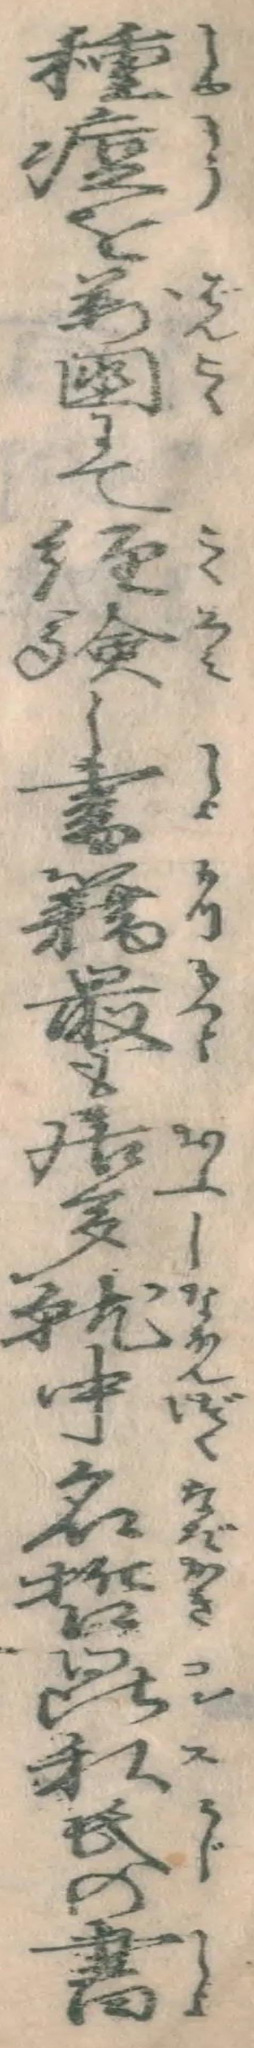種痘を万国にて経験し書籍最も居多就中名哲混私氏の書
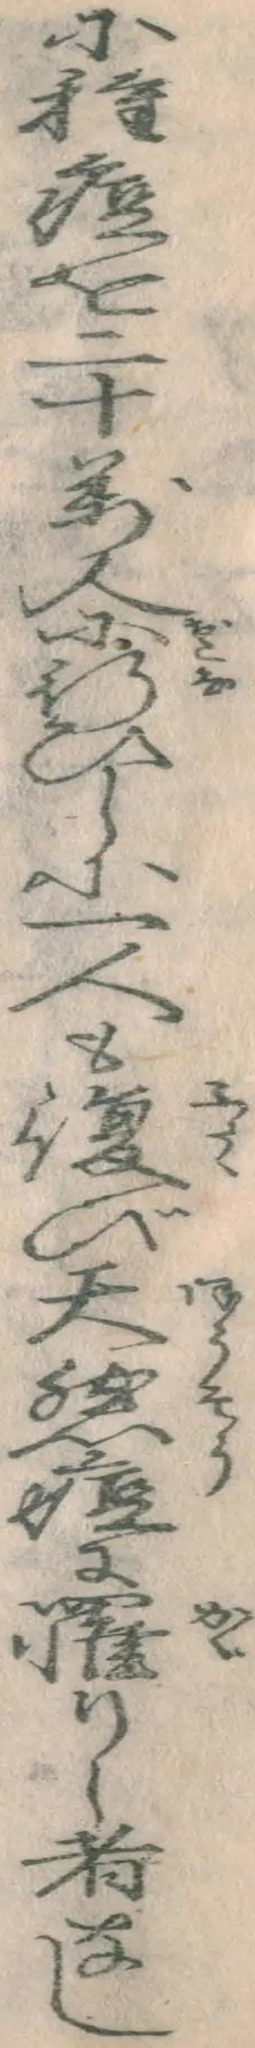に種痘を二十万人に行ひしに一人も復び天然痘に罹りし者なし
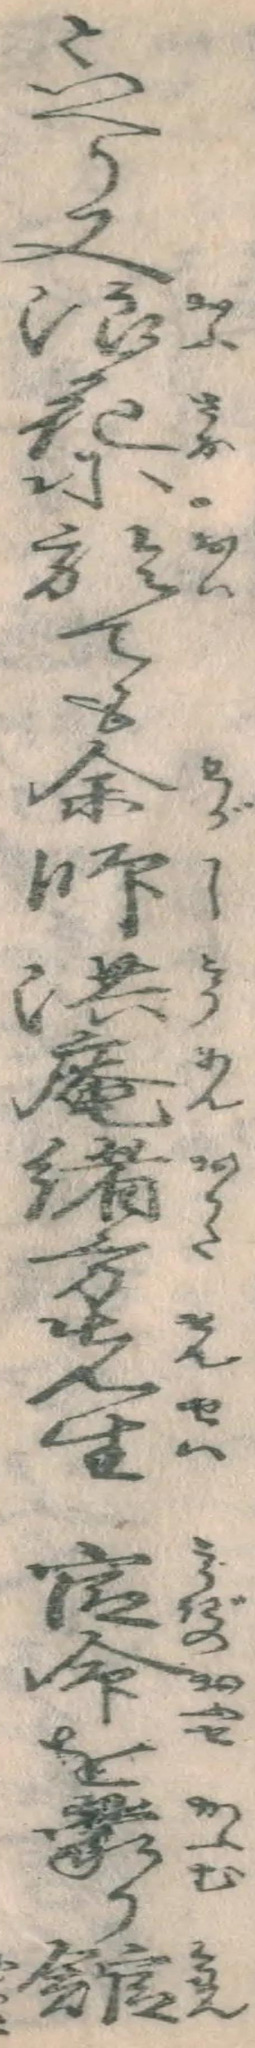といへり又浪花に。於ても余師洪庵緒方先生官命を蒙り館
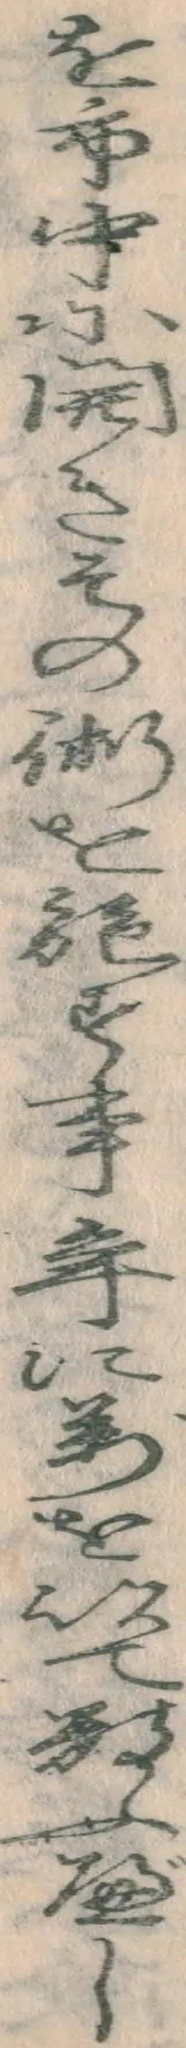を市中に開きその術を施す事年に万を以て数ふべし
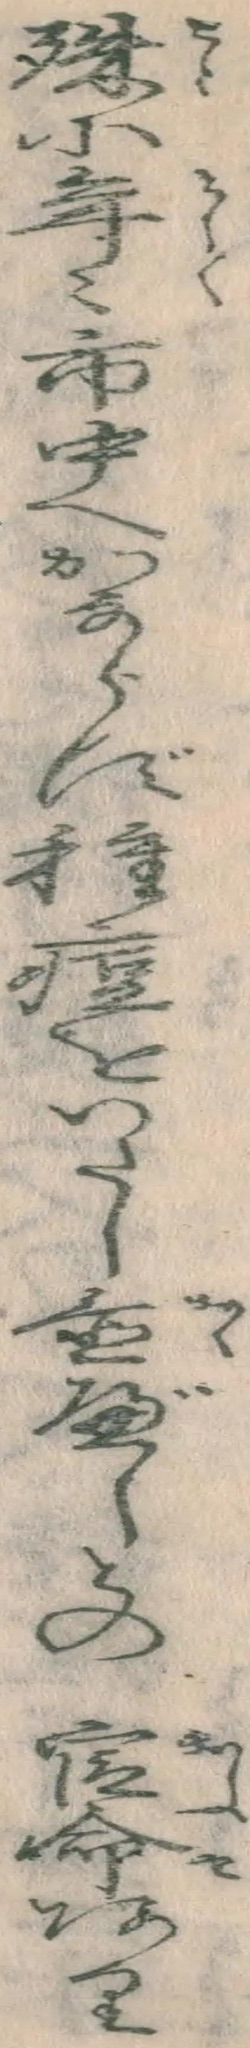殊に年々市中へかならず種痘をいたし置べしとの官命あり
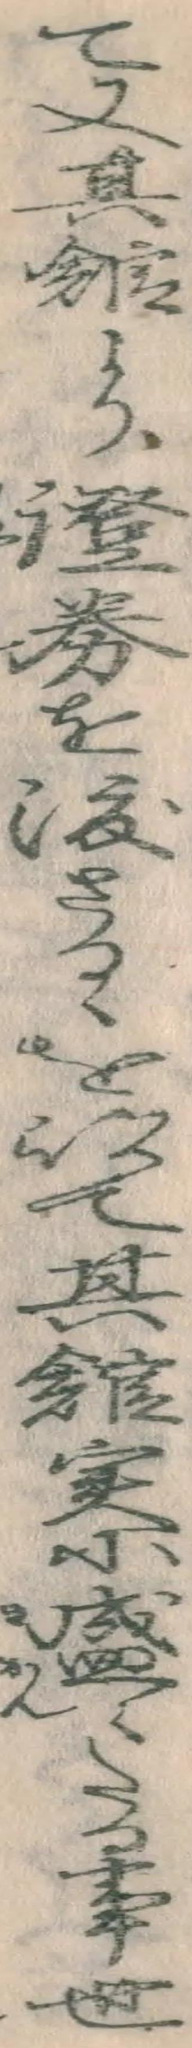て又其館証券を渡さるゝを以て其館実に盛々たる事世
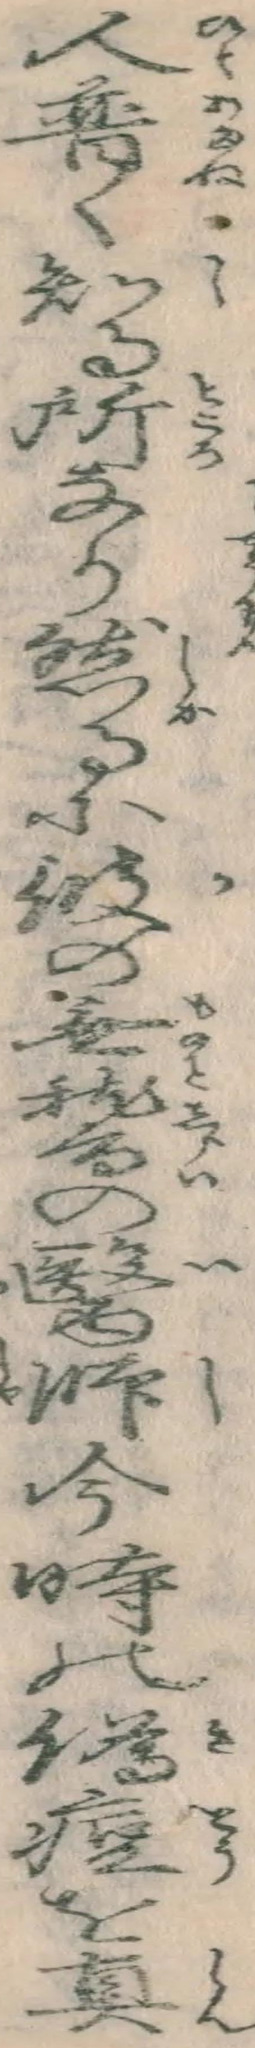人普く知る所なり然るに彼の無稽の医師今時の偽痘を真
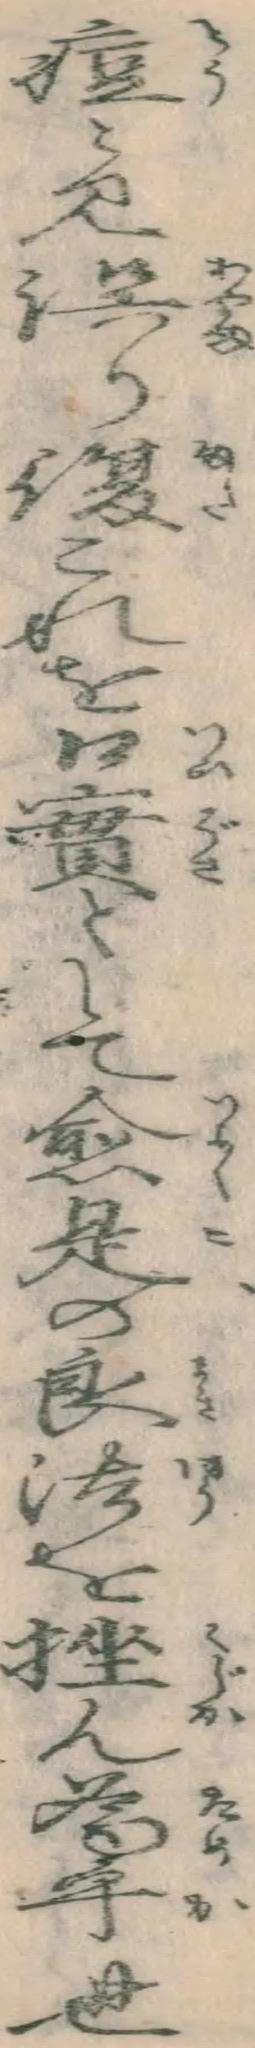痘と見誤り復これを口実として愈是の良法を挫ん為乎世
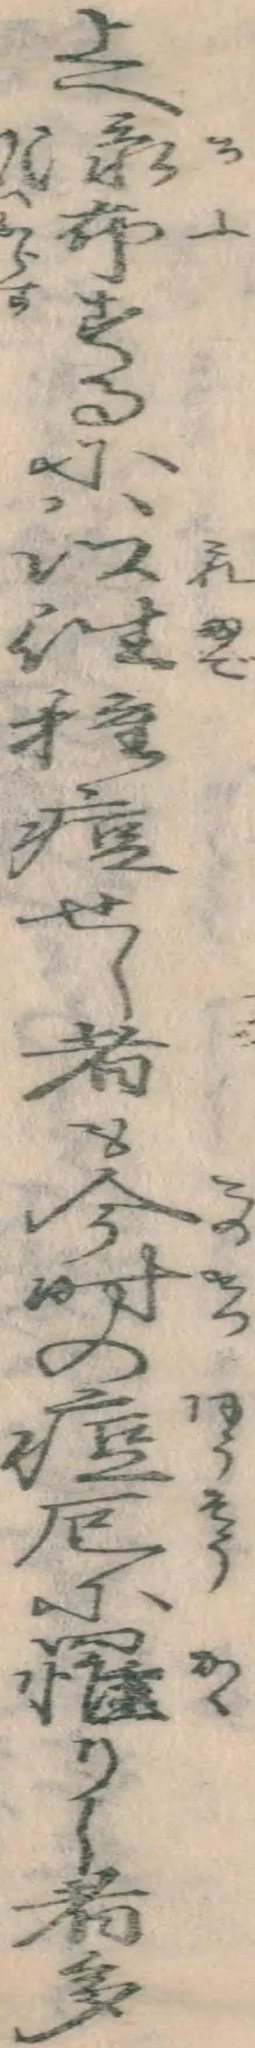上へ流布するには以往種痘せし者も今時の痘厄に罹りし者多
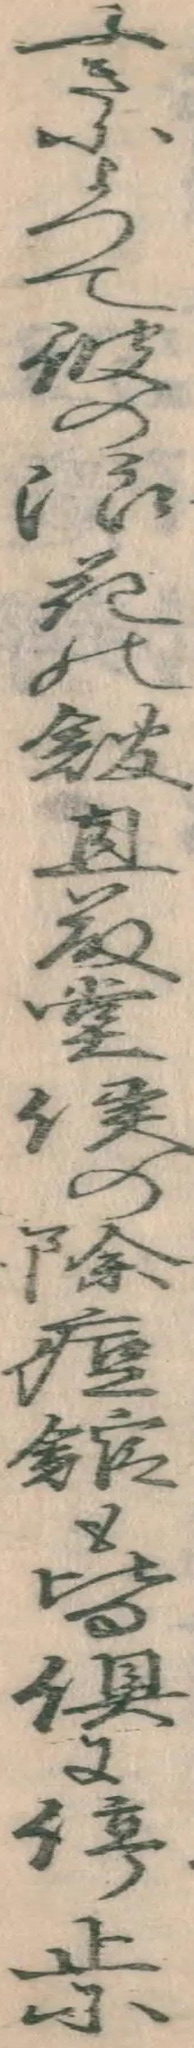ふきによつて彼の浪花の館且藤堂侯の徐痘館も皆倶に停止に
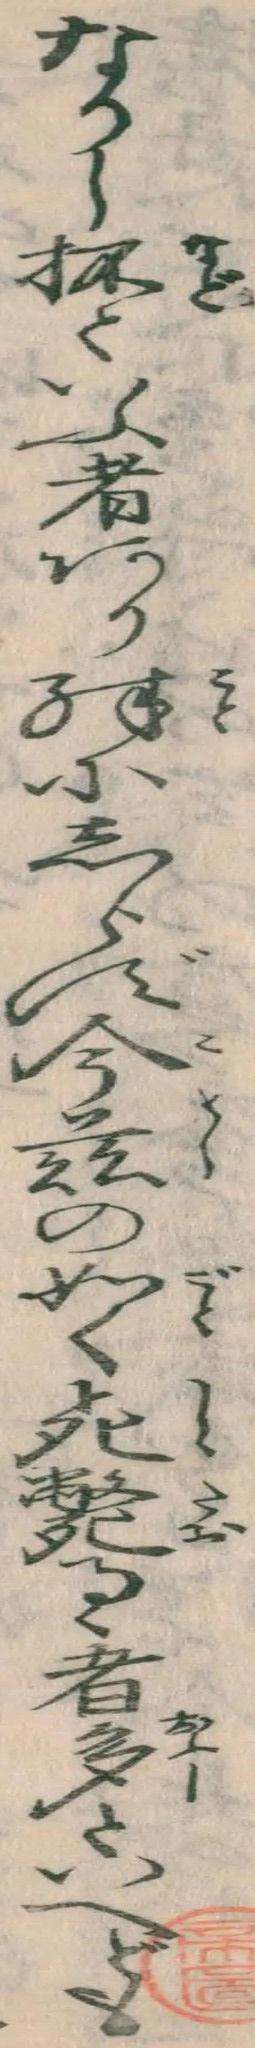なりし杯といふ者あり殊にしらず今茲の如く死斃るゝ者多といへども
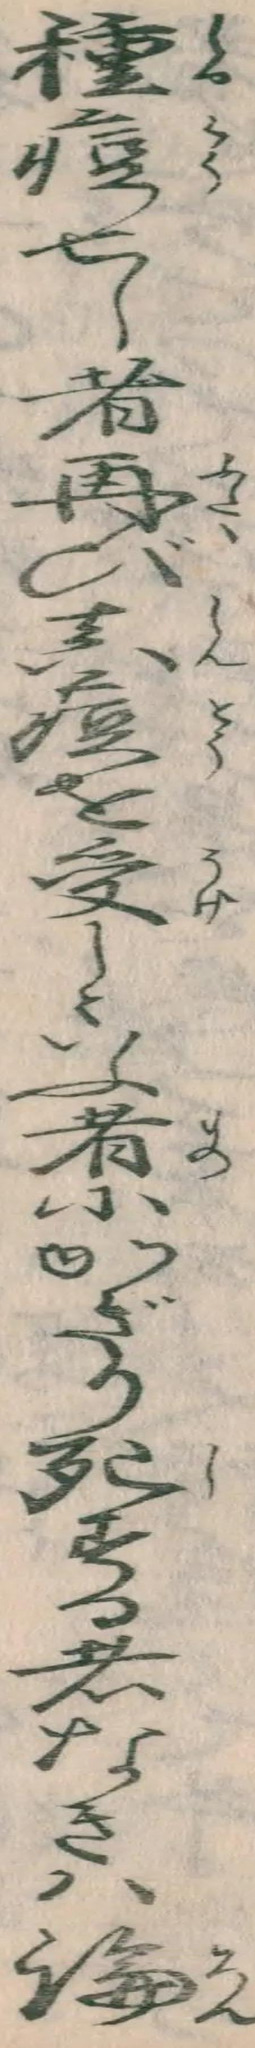種痘せし者再び真痘を受しといふ者にかぎり死する者なきは論
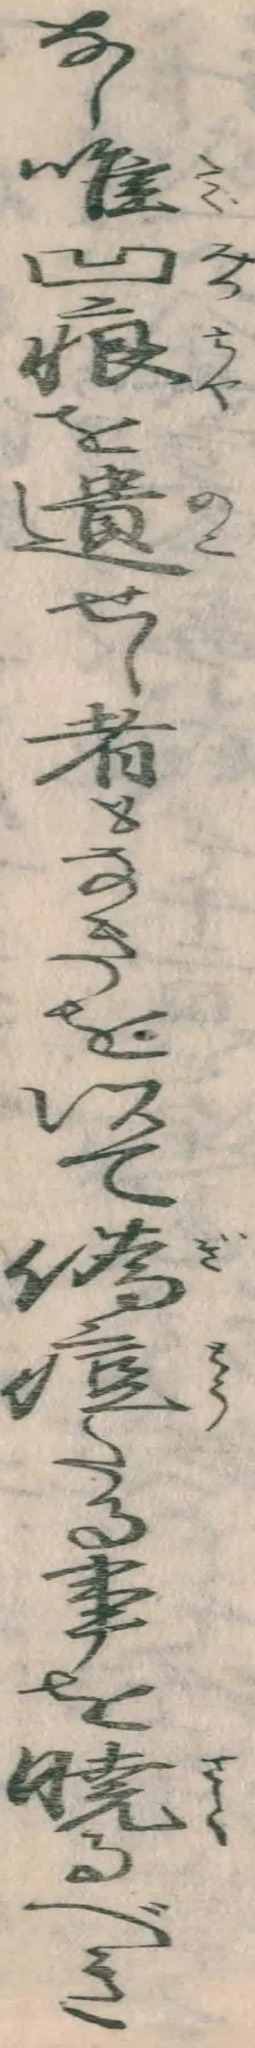なし唯凹痕を遺せし者もなきを以て偽痘たる事を暁るべき
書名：種痘辨
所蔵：国立国会図書館 National Diet Library, JAPAN
